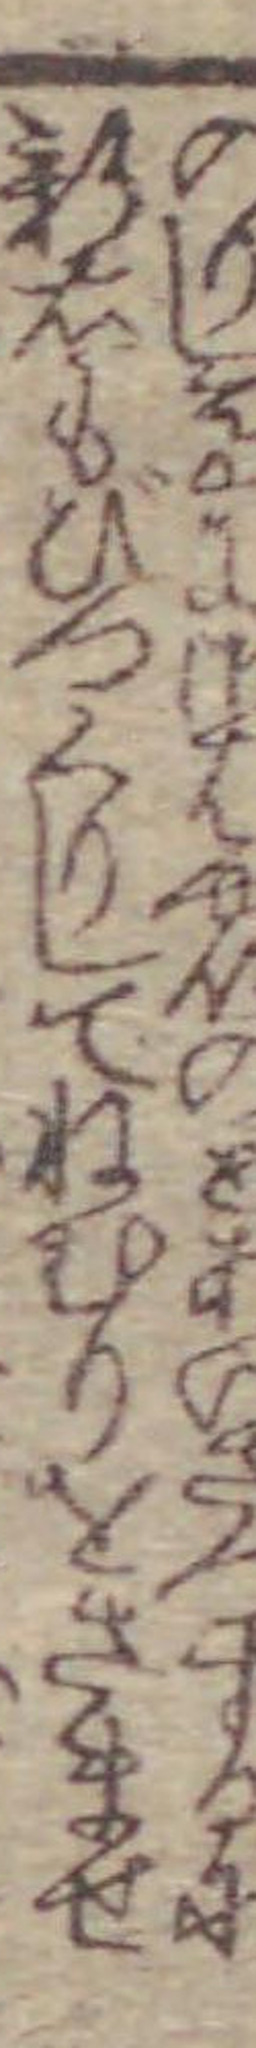新右もびつくりしてねむりをさませ
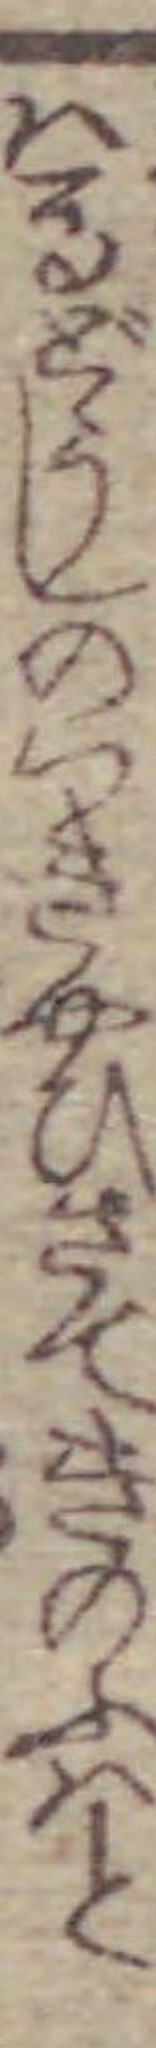は馬どうしのつきやひさてきのふはと
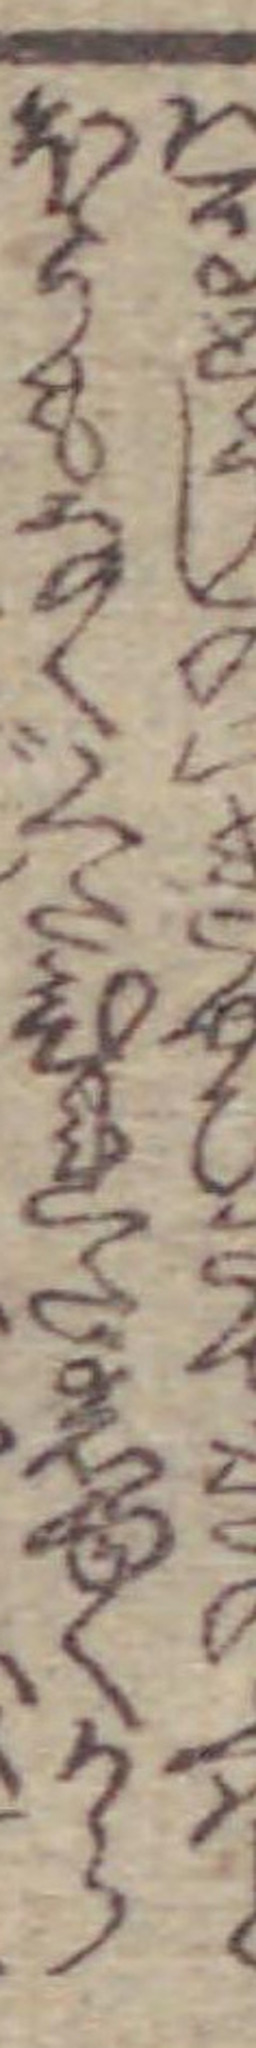ほうもなくくたひれたしゆくから
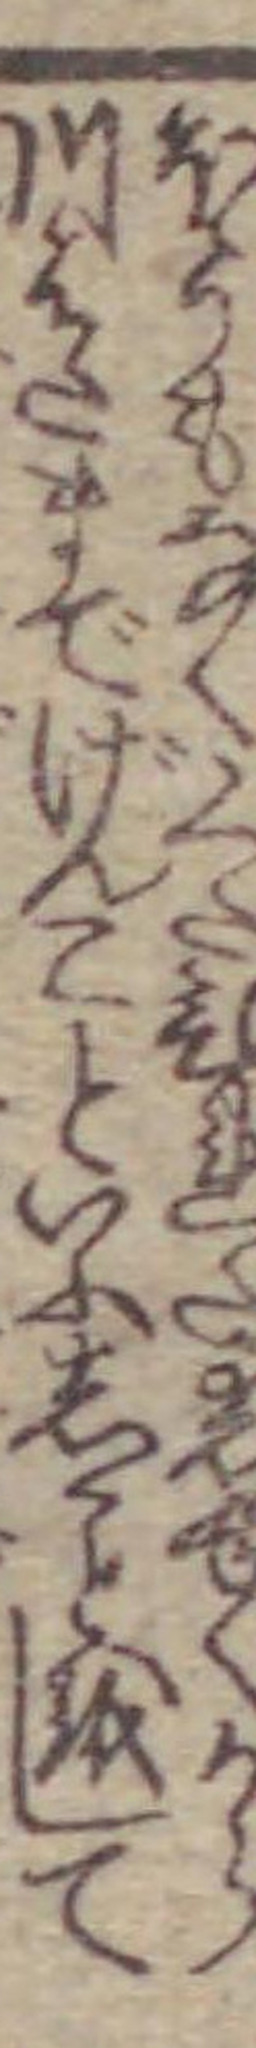川はたまでげんこといふしことをして
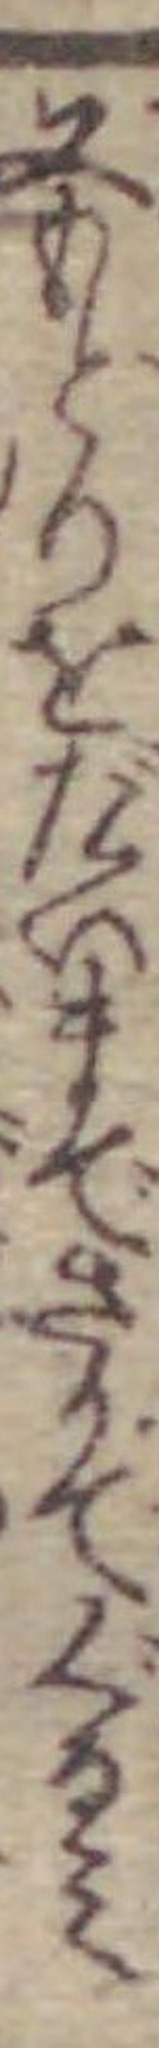又もどりをだいまでさかてぐるみ
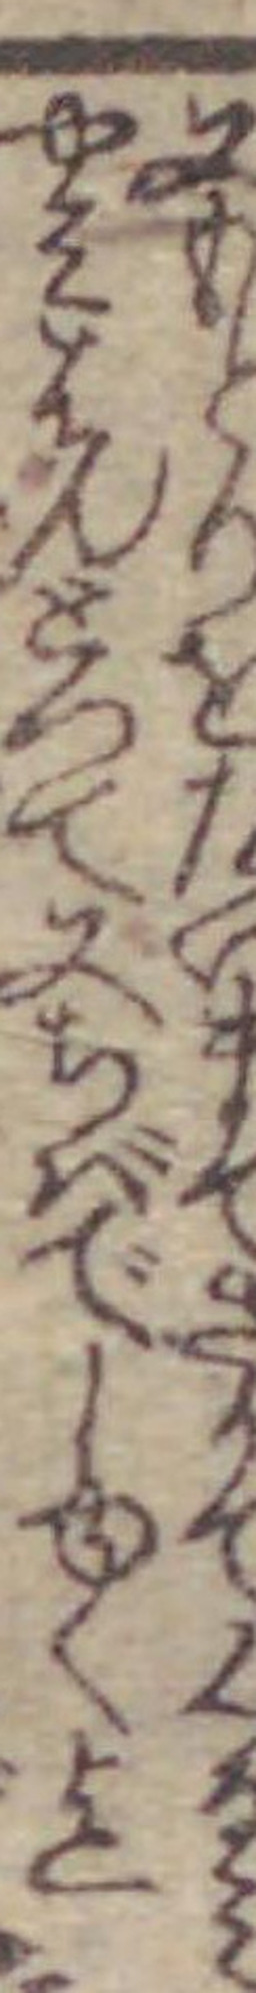やみはんとつて又ちばでしゆく迄
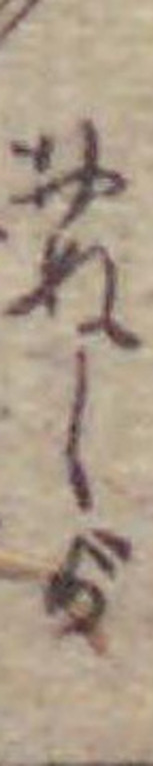おぬしが
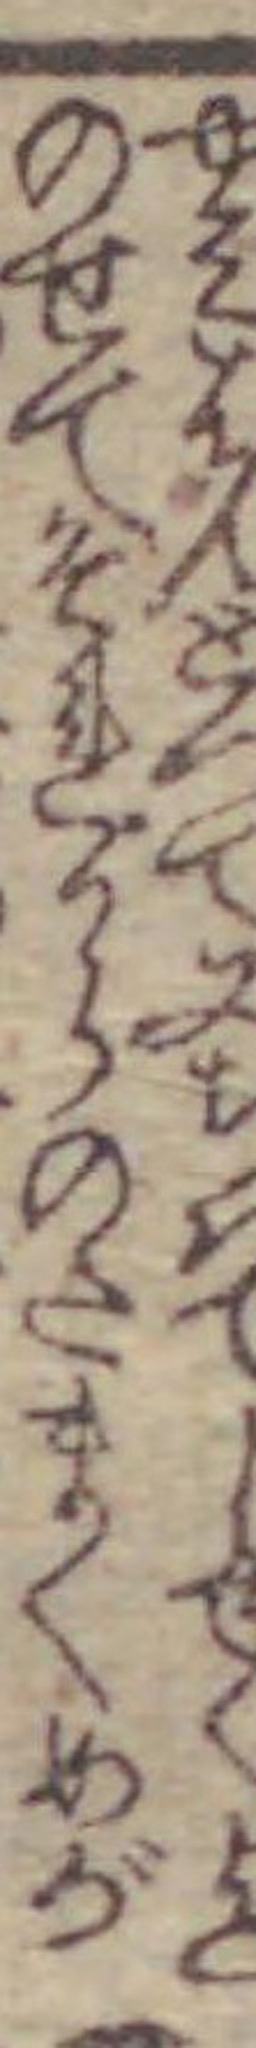のせてそれからのたまくめが
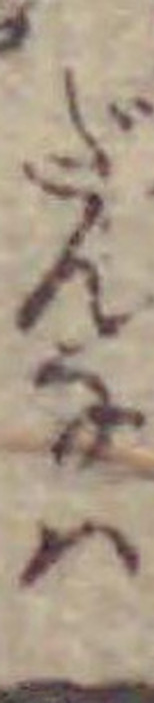だんなは
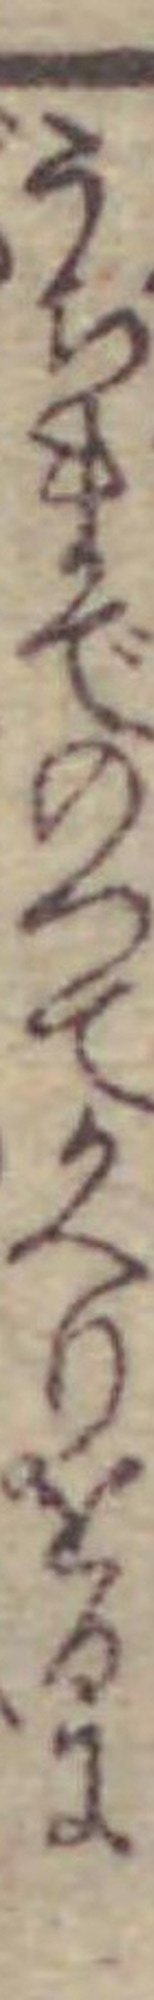うちまでのつてかへりをるに
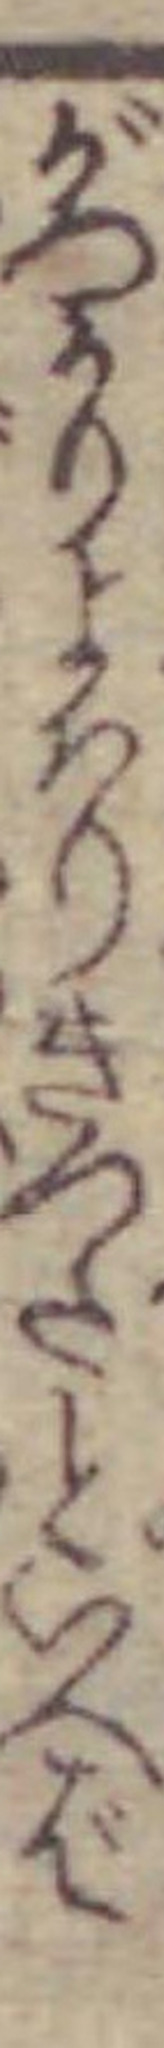がつかりよはりきつたといへば
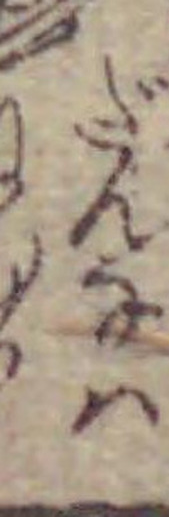だんなは
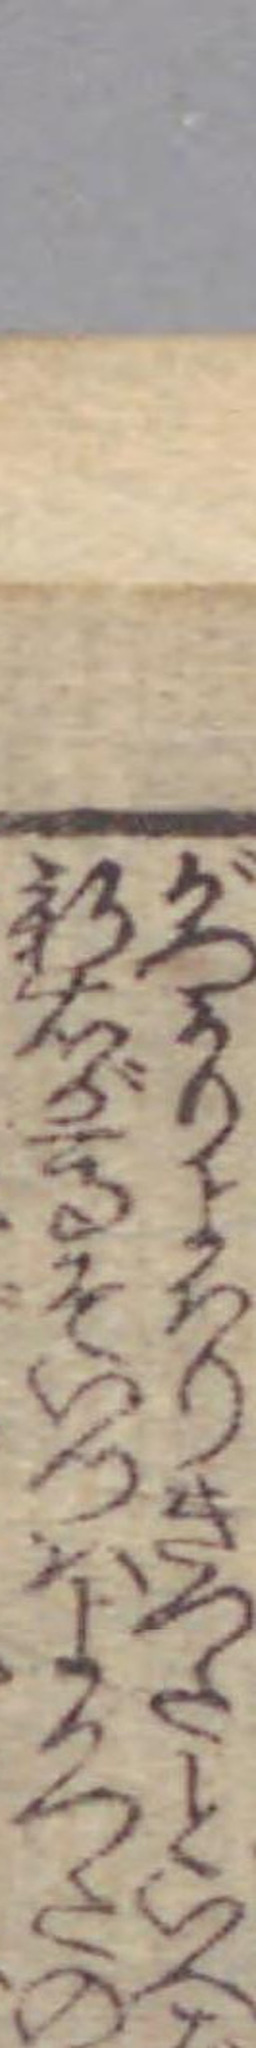新右が馬そいつはよかつたの
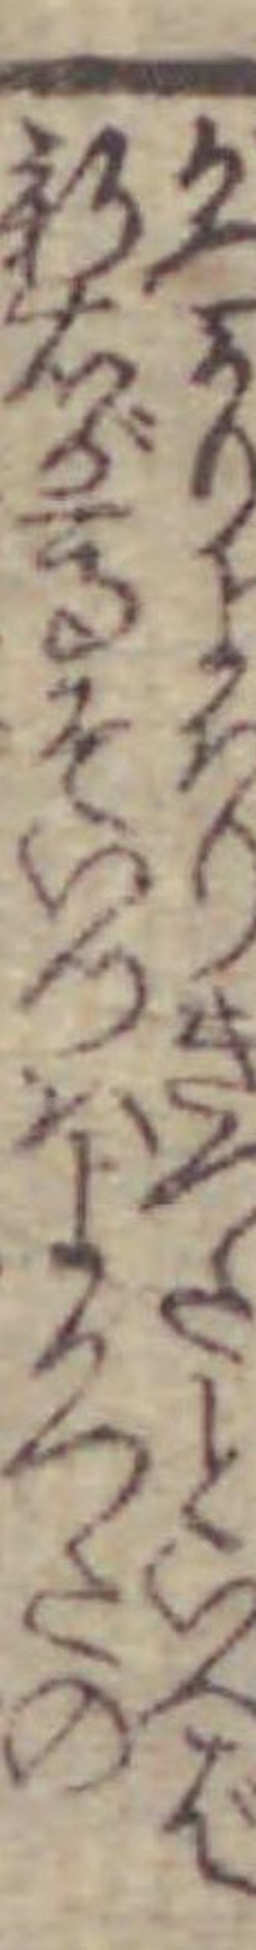新右が馬そいつはよかつたの
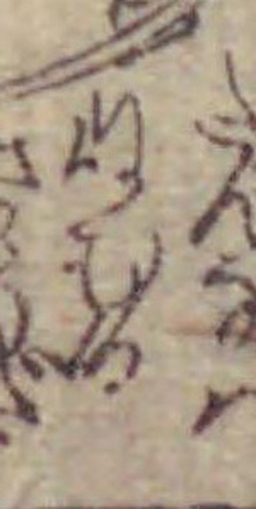ねむる
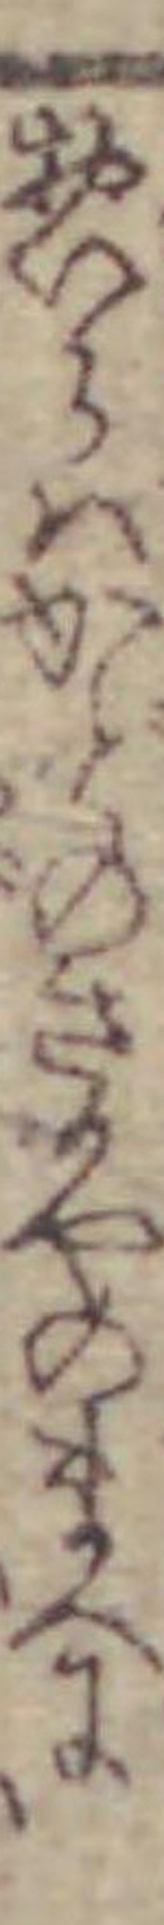おいらはかどのさかやのまへに
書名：即席耳学問 : 3巻
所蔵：国立国会図書館 National Diet Library, JAPAN
